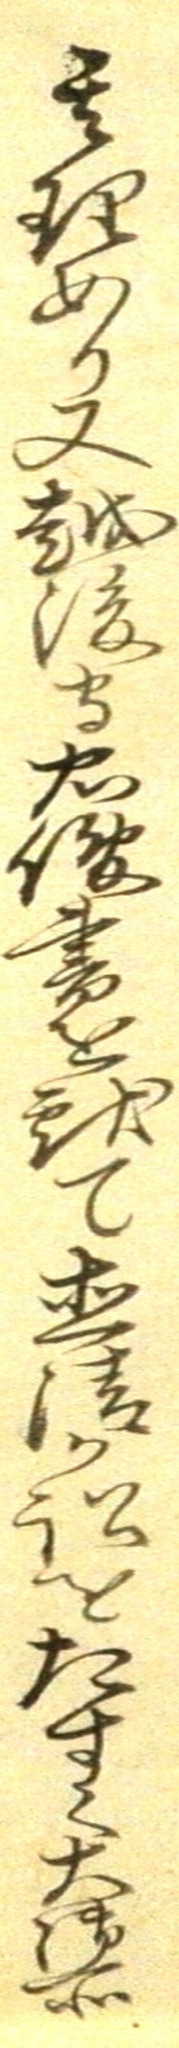其理あり又越後守忠俊書を献て直清か訟をたすく大御所
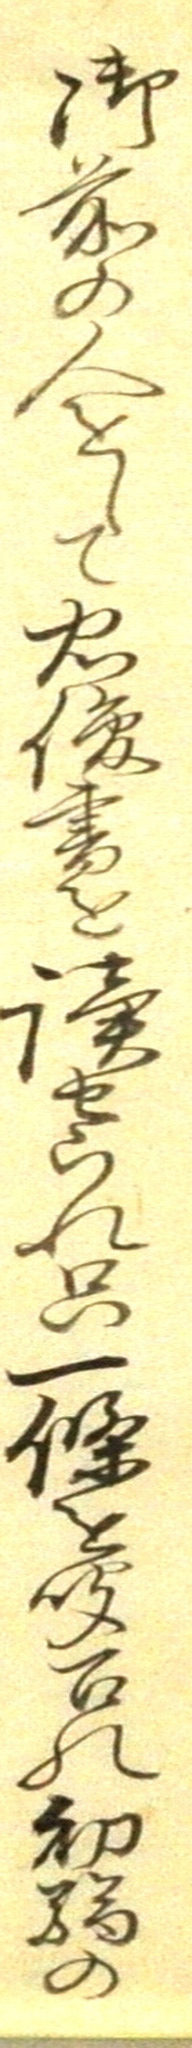御前の人をして忠俊書を読せられ只一条を聞召れ幼弱の
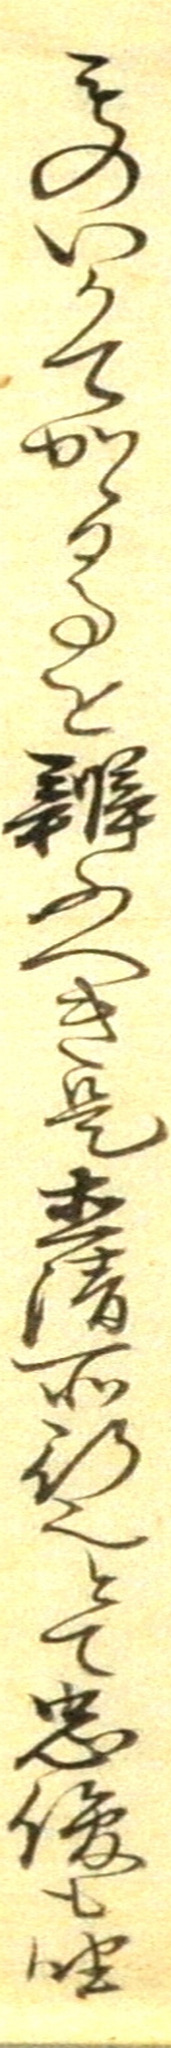ものいかてかゝる事を弁ふへき是直清所行也とて忠俊も坐
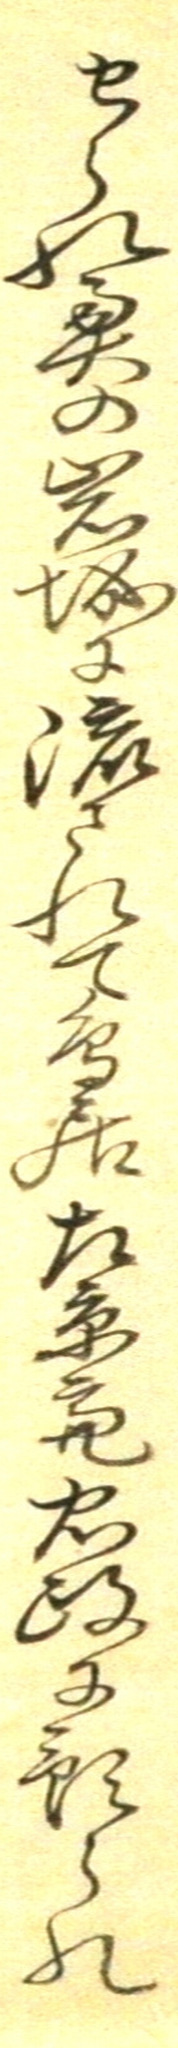せられ奥の岩城に流されて鳥居左京亮忠政に預られ
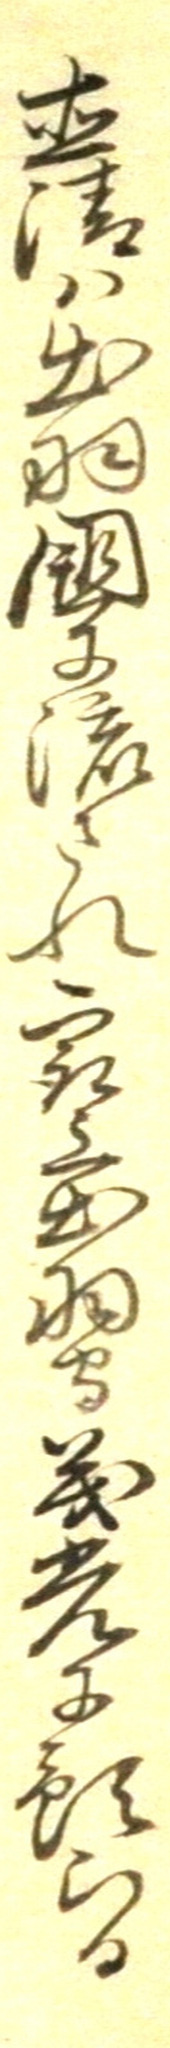直清は出羽国に流され最上出羽守義光に預らる
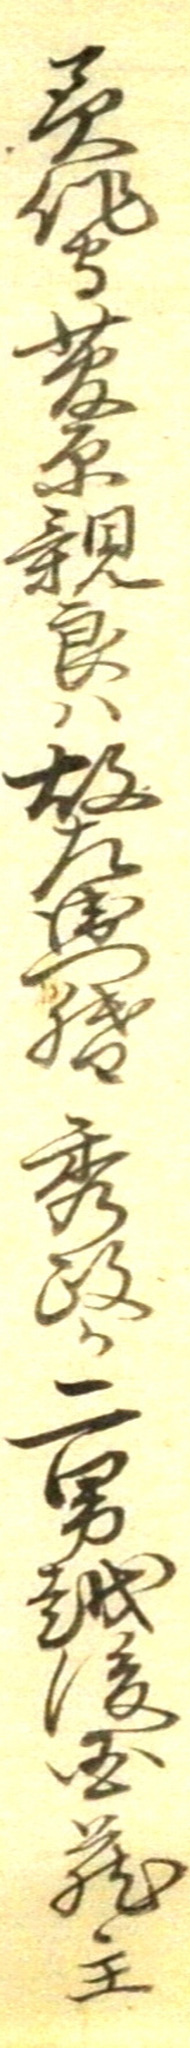美作守菅原親良は故左衛門督秀政か二男越後国蔵王
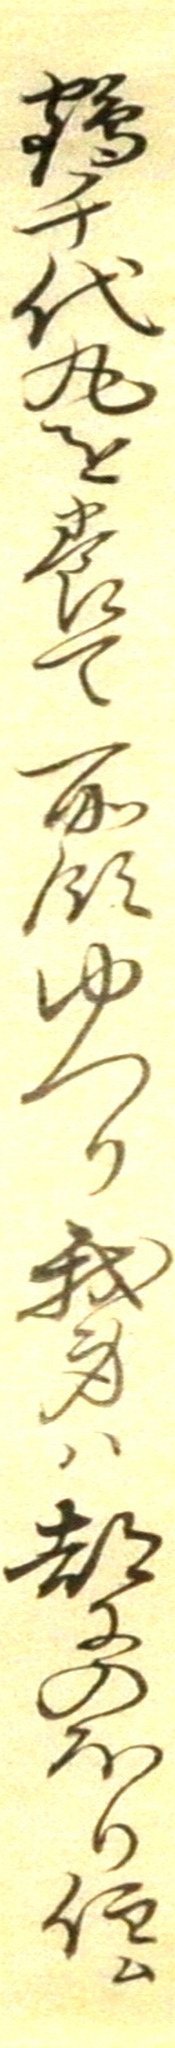鶴千代丸を養て所領ゆつり我身は都にのほり住
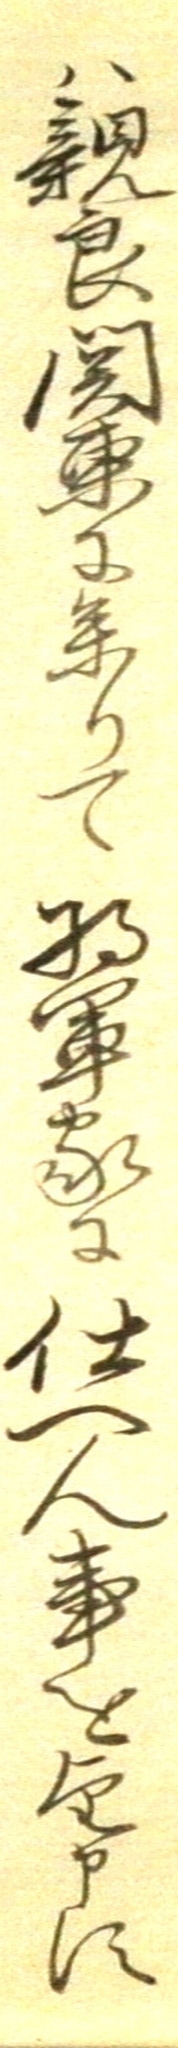は親良関東に参りて将軍家に仕へん事を望申す
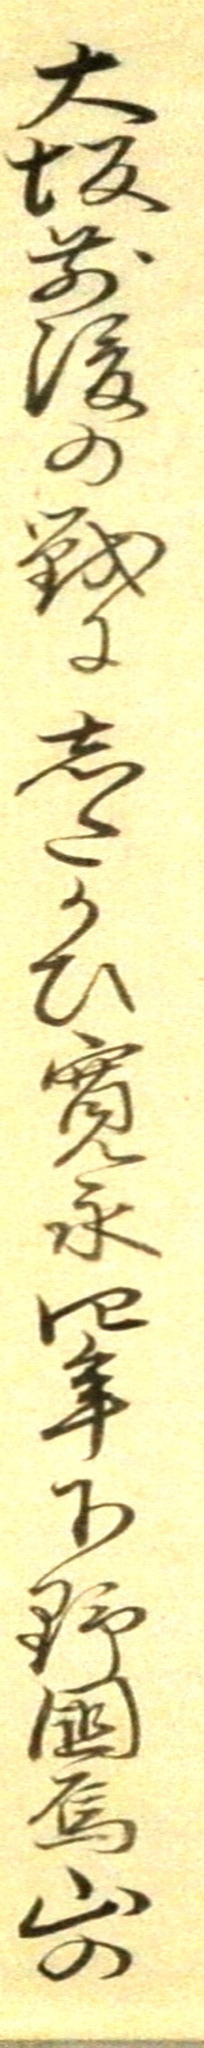大坂前後の戦にしたかひ寛永四年下野国烏山の

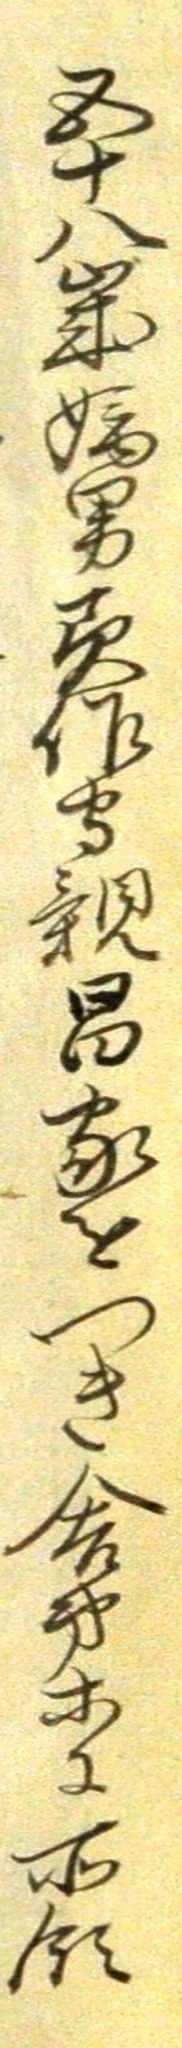五十八歳嫡男美作守親昌家をつき舎弟等に所領
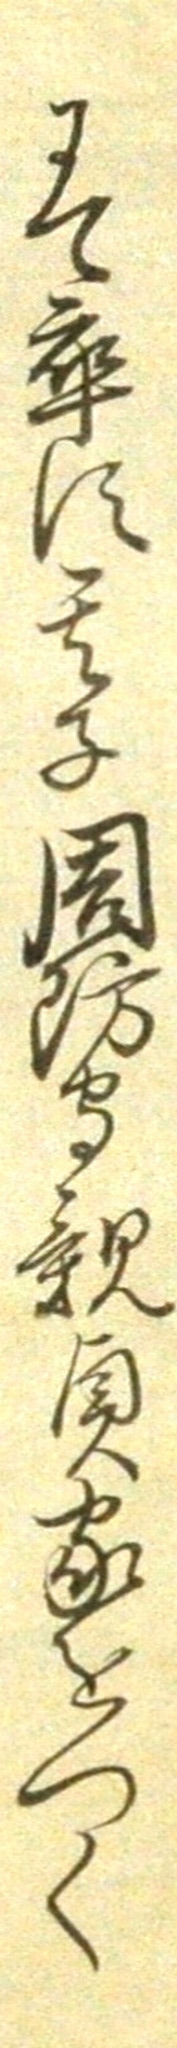にて卒す其子周防守親貞家をつく
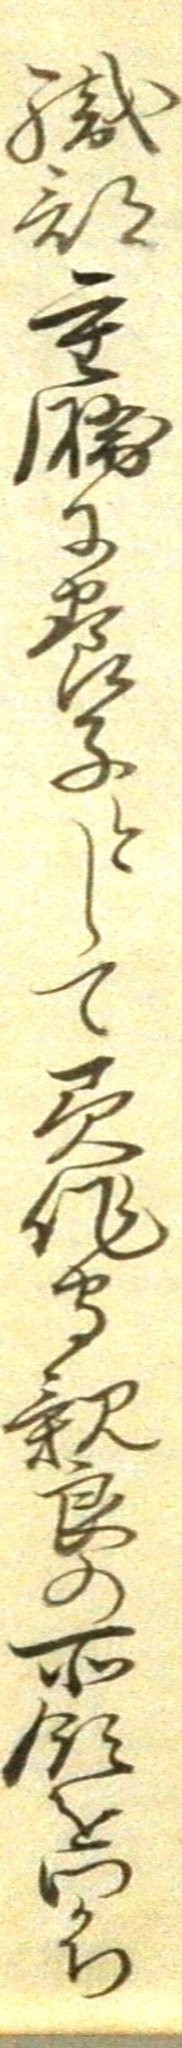織部重勝に養子として美作守親良の所領をわかち
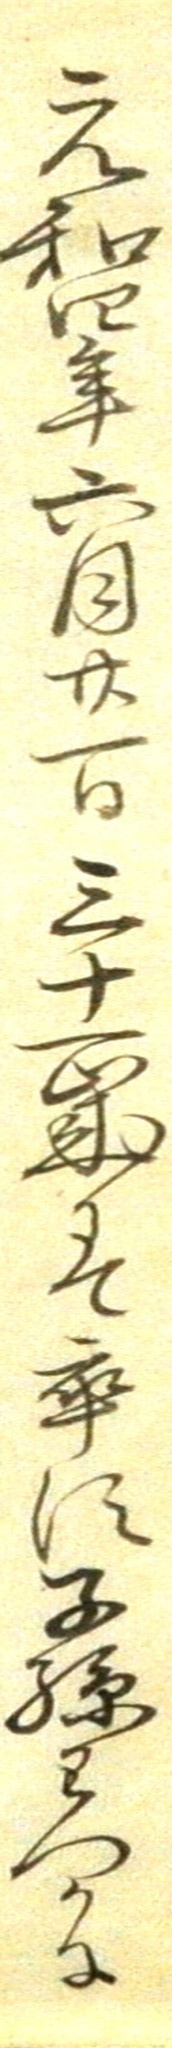元和四年六月廿一日三十一歳にて卒す子孫わつかに
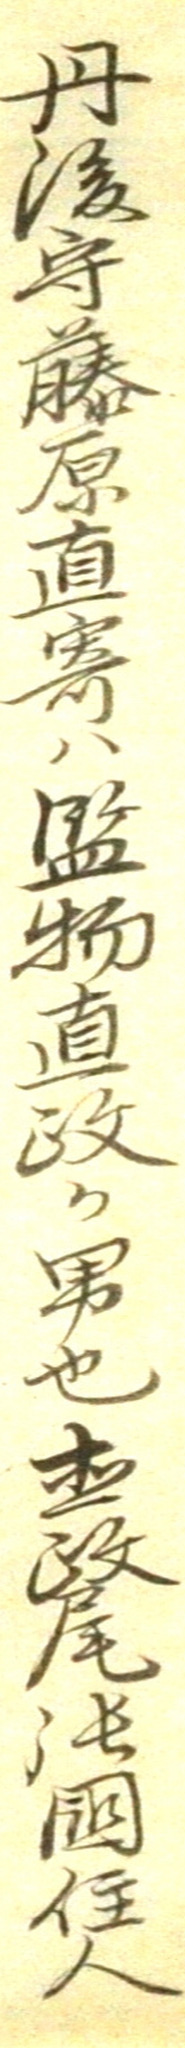丹後守藤原直寄は監物直政か男也直政尾張国住人
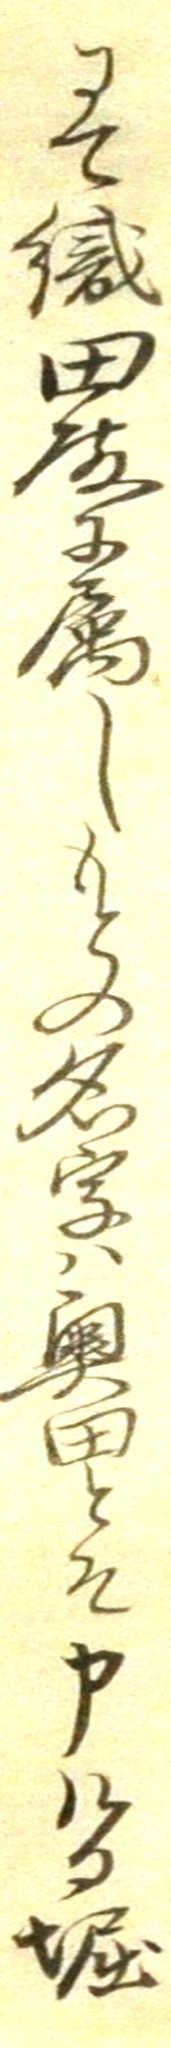にて織田殿に属しもとの名字は奥田とそ申ける堀
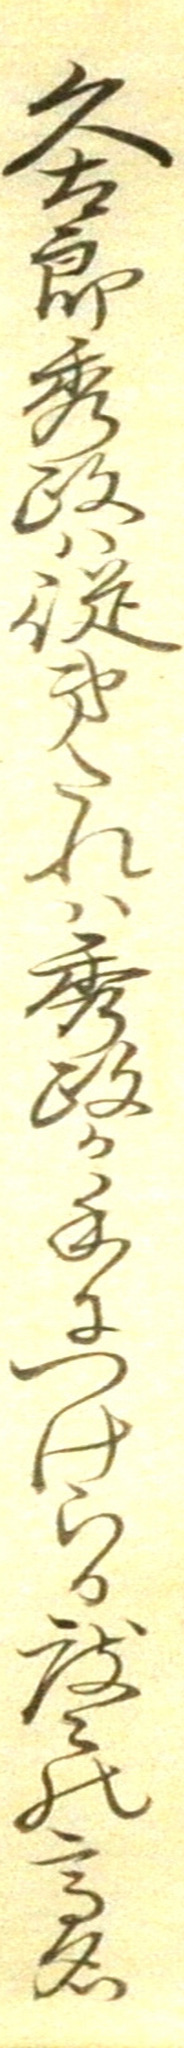久太郎秀政は従弟たれは秀政か手につけらる度々の高名
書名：藩翰譜（七・上）
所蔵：伊那市立高遠町図書館・合同会社AMANE
